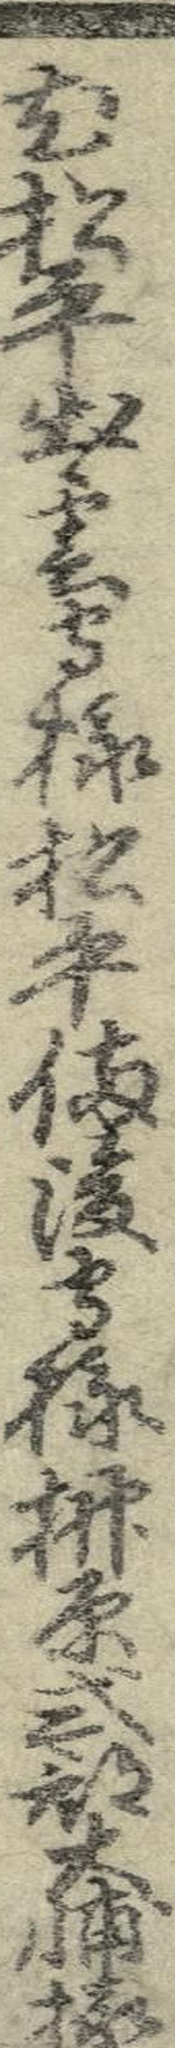尤松平出雲守様松平備後守様榊原式部大輔様
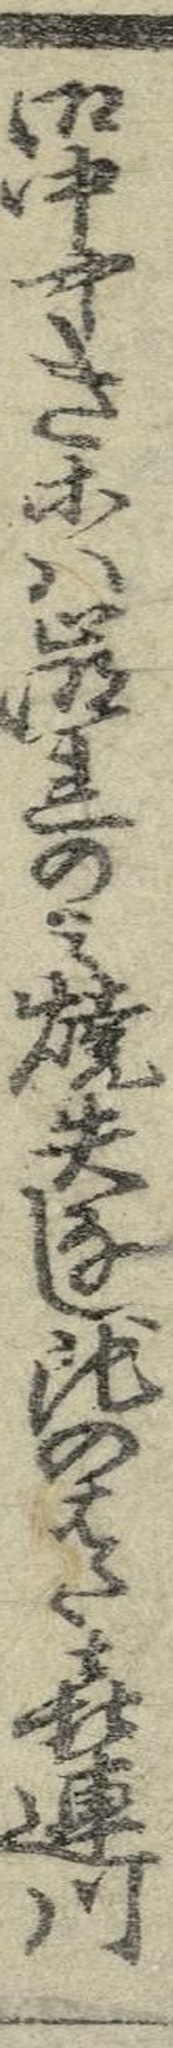御中やしき等は崩れのみ焼失なし池のはた喜連川
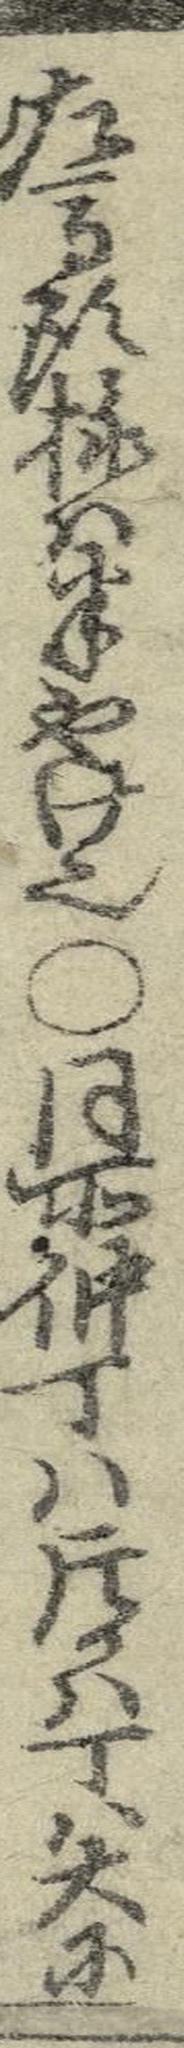左馬頭様ハ半やけ也〇同所仲丁ハ片かハ丁ハ大に
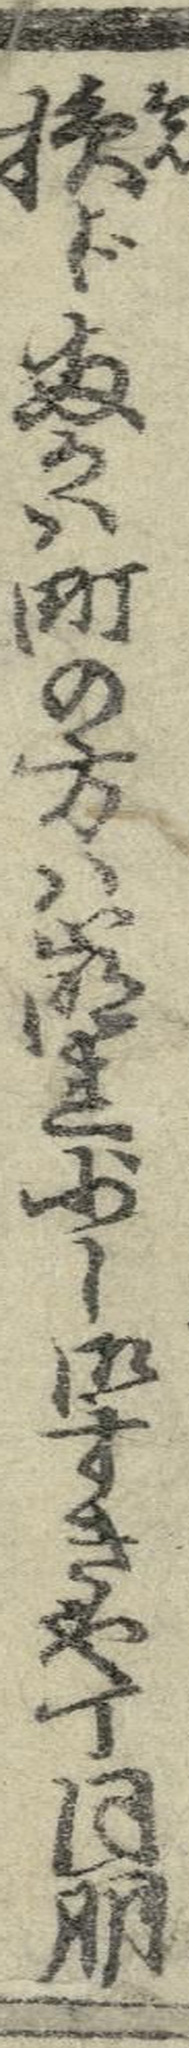損じ両かハ町の方ハ崩れ少し御すきや丁同朋
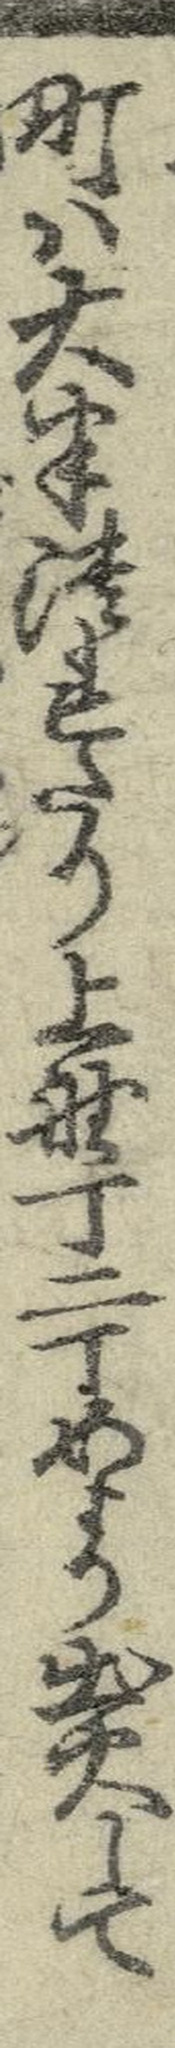町ハ大半潰れたり上野丁二丁めより出火して
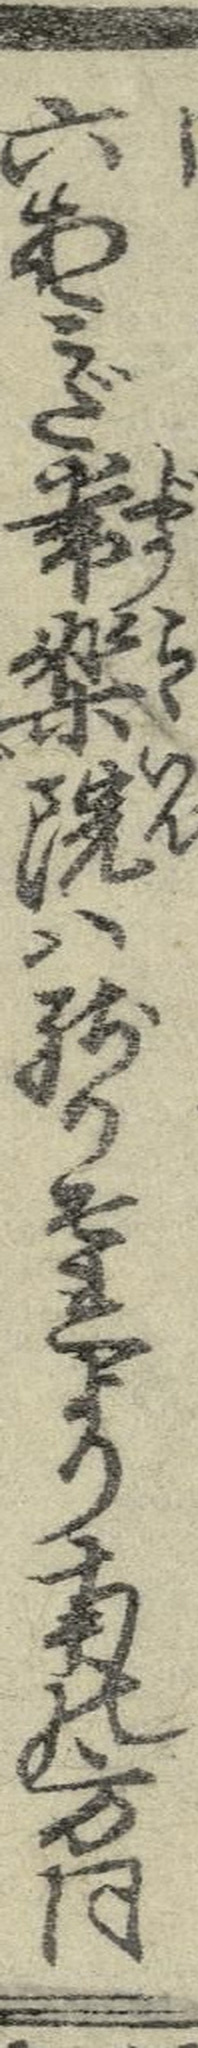六あみだ常楽院ハ残りそれより南の方同
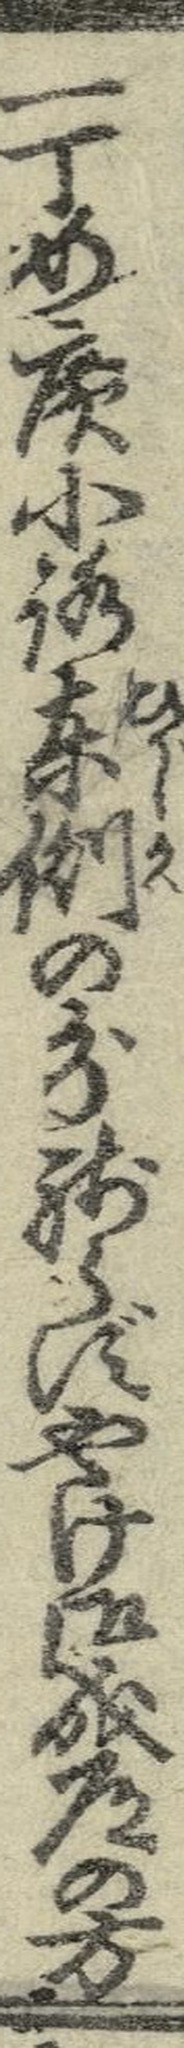一丁め廣小路東側の分残らずやけ御成道の方
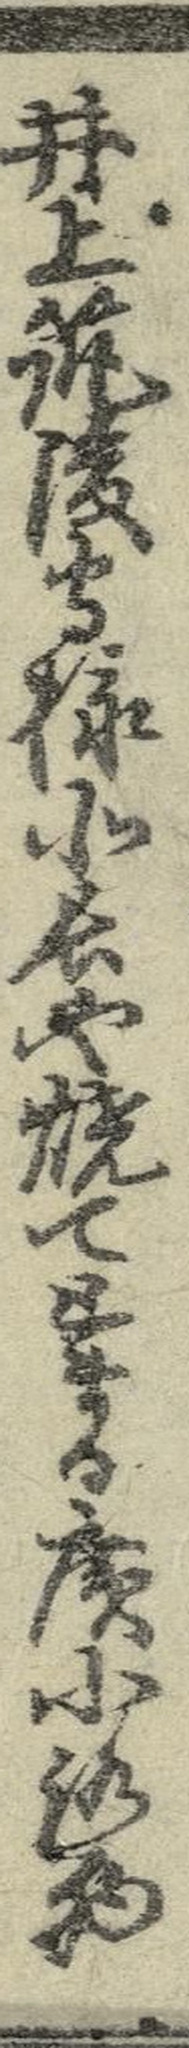井上筑後守様北長や焼てとまる廣小路西
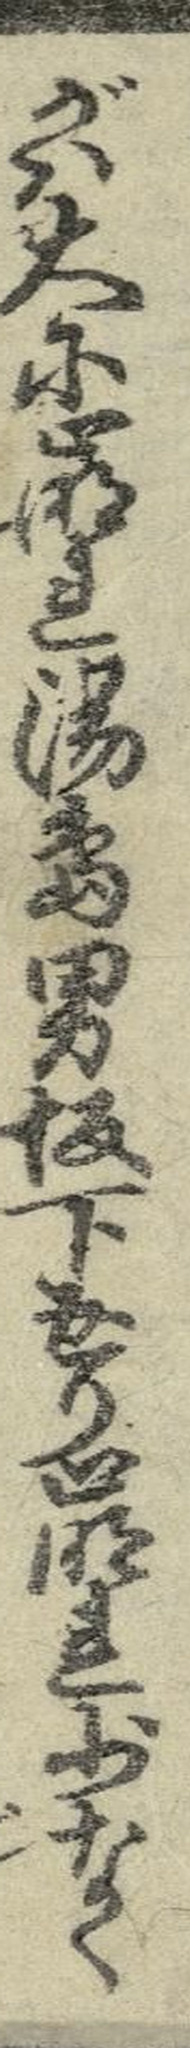がハ大に崩れ湯嶋男坂下通り崩れ少なく
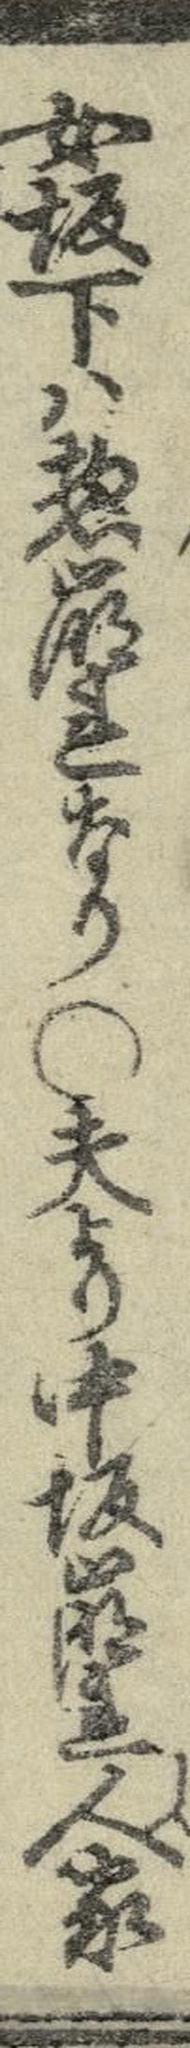女坂下ハ惣崩れなり〇夫より中坂崩れ人家
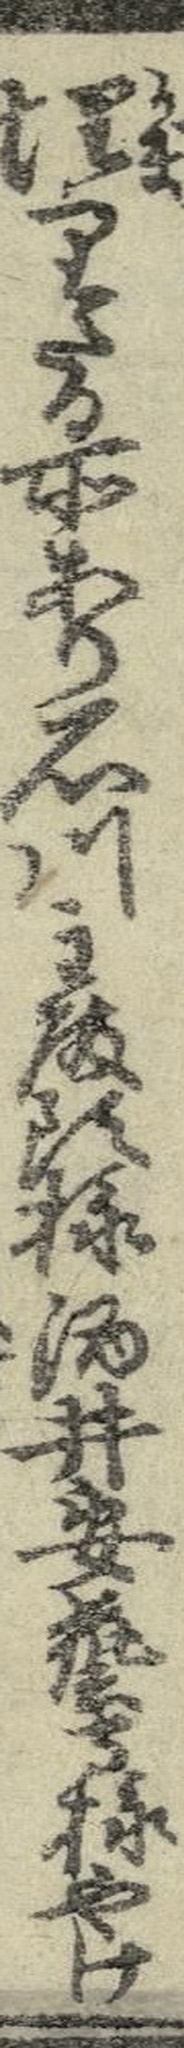埋りたる所あり石川主殿頭様酒井安藝守様やけ
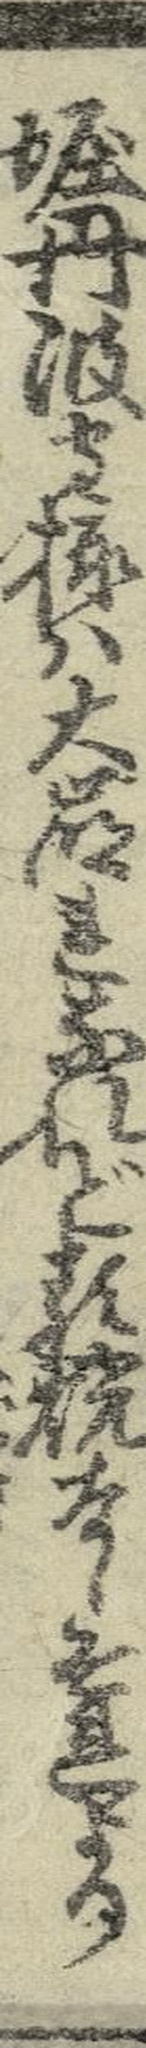堀丹波守様ハ大崩れなれど類焼なしそれより
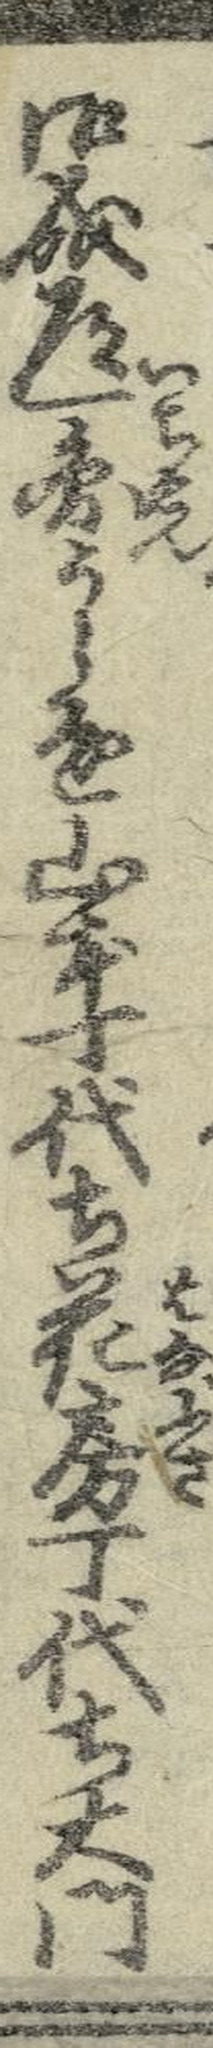御成道一圓うら通山本丁代ち花房丁代ち大門
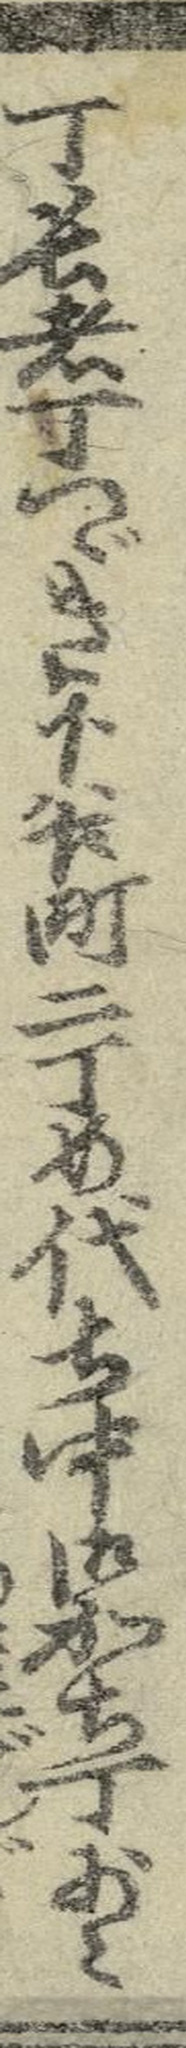丁長者丁つゞき下谷町二丁め代ち中御かち丁少し
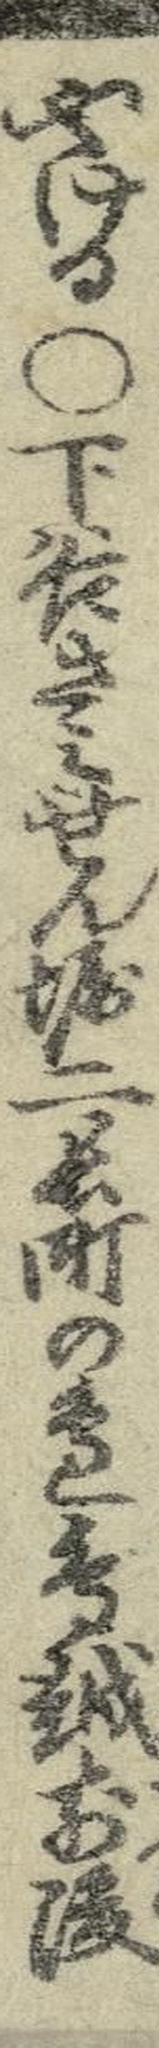やける〇下谷さみせん堀二長町の辺鳥越前渡
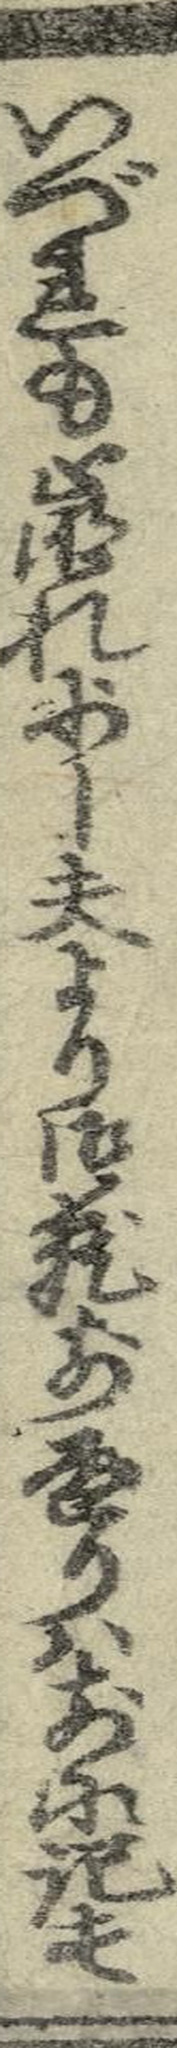いづれも崩れ少し夫より御蔵前通りハ前に記す
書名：地震並出火細見記
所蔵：東京大学地震研究所図書室 Earthquake Research Institute Library, The University of Tokyo, JAPAN
